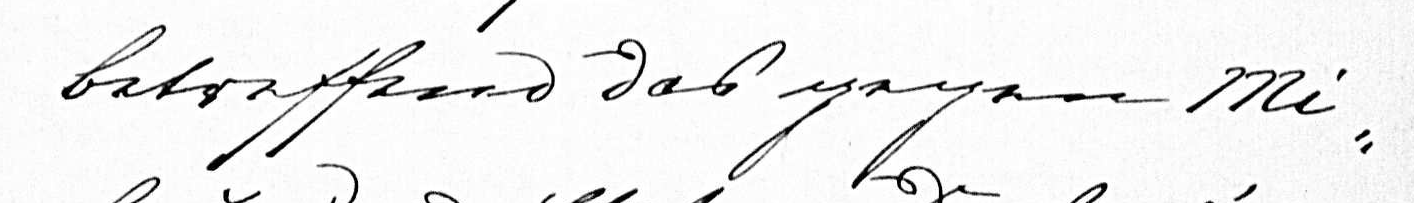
betreffend das gegen Mi¬
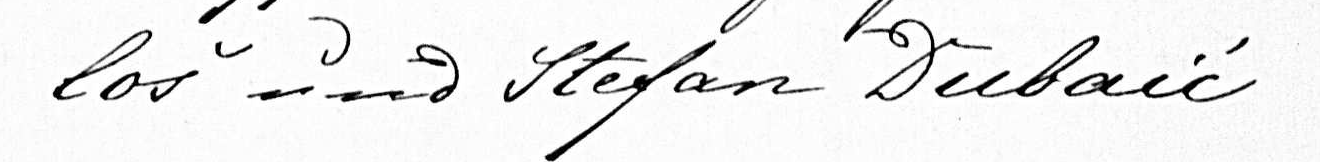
loš und Stefan Dubaić
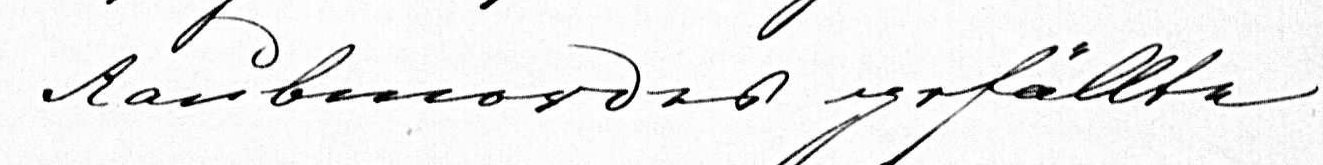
Raubmordes gefällte
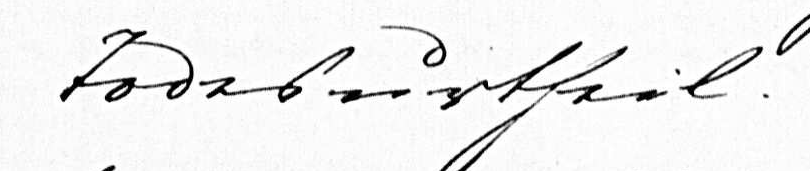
Todesurtheil.
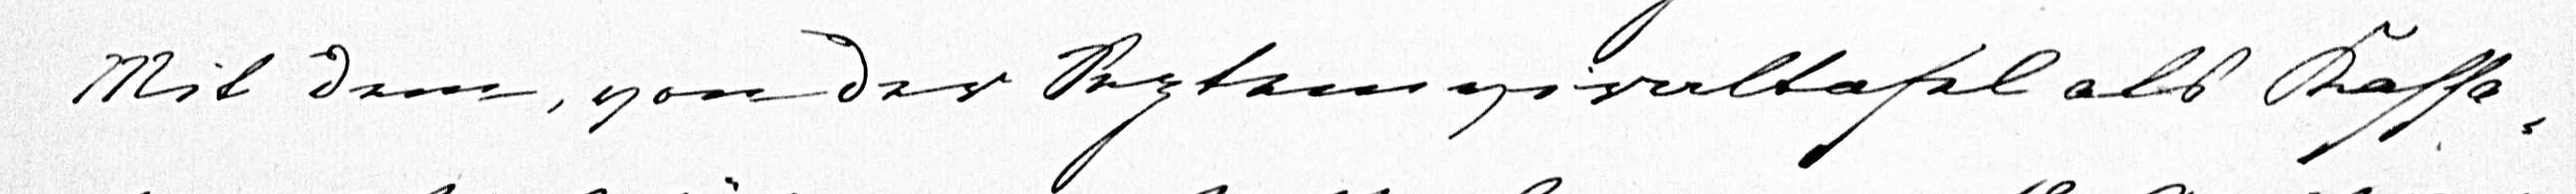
Mit dem, von der Septemviraltafel als Kassa¬
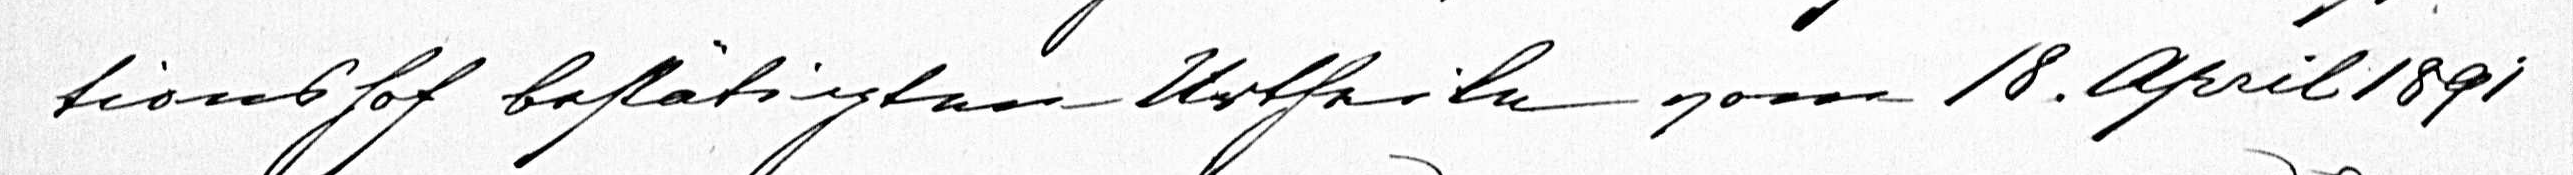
tionshof bestätigten Urtheile vom 18. April 1891
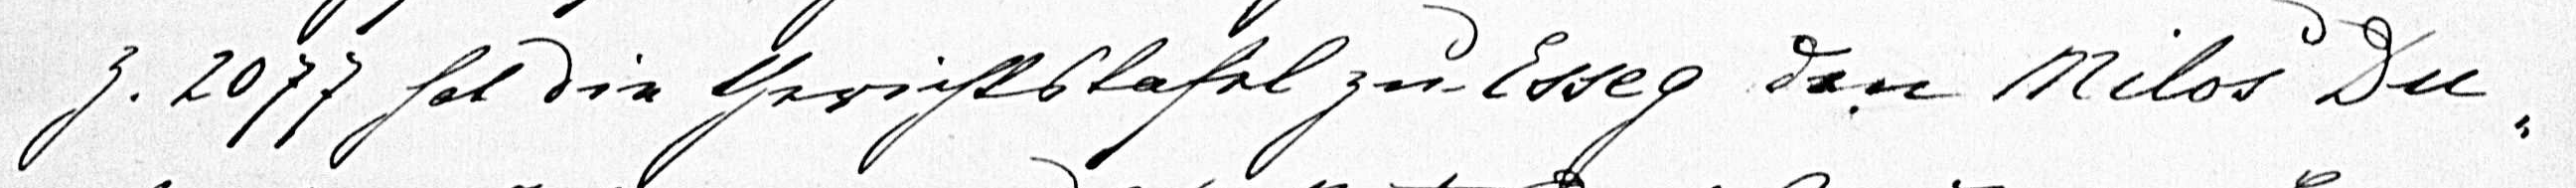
Z. 2077 hat die Gerichtstafel zu Esseg den Miloš Du¬
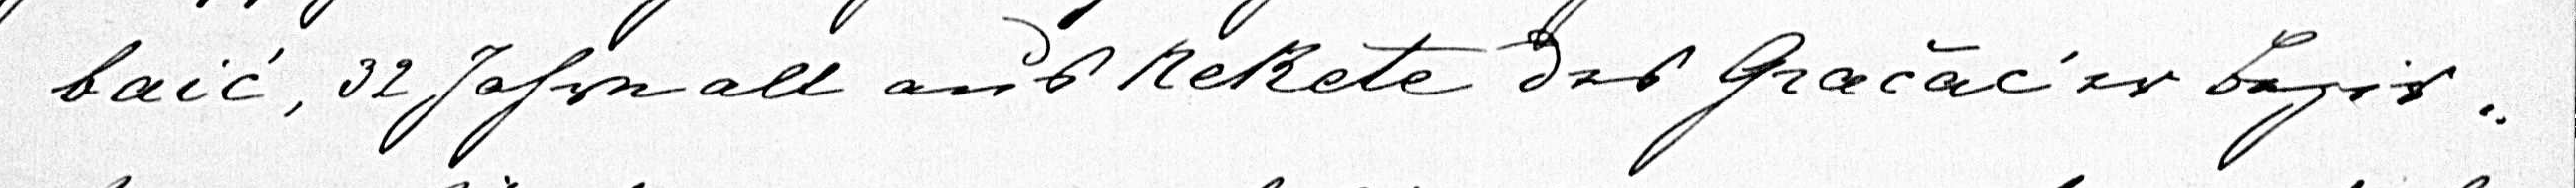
baić, 32 Jahre alt aus Nekete [Neteka] des Gračac’er Bezir¬
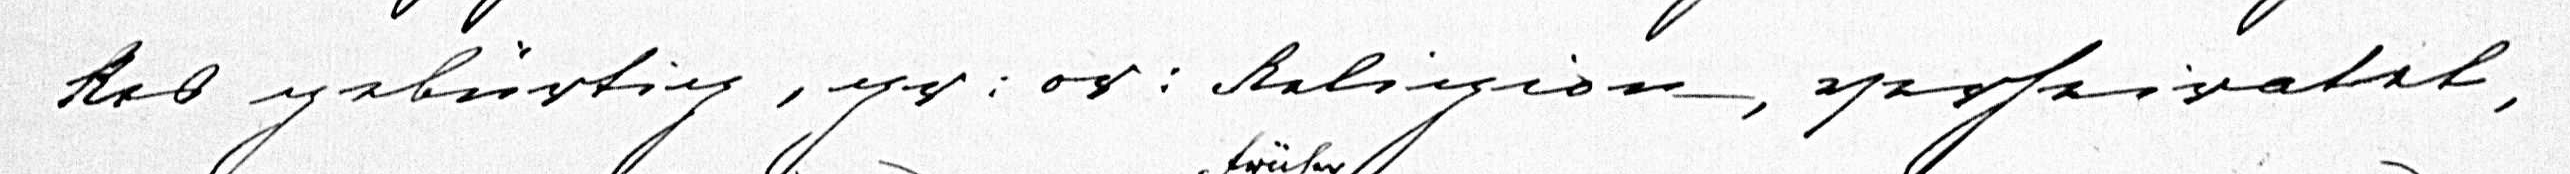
kes gebürtig, gr. or. Religion, verheiratet,
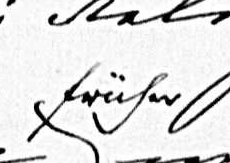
früher
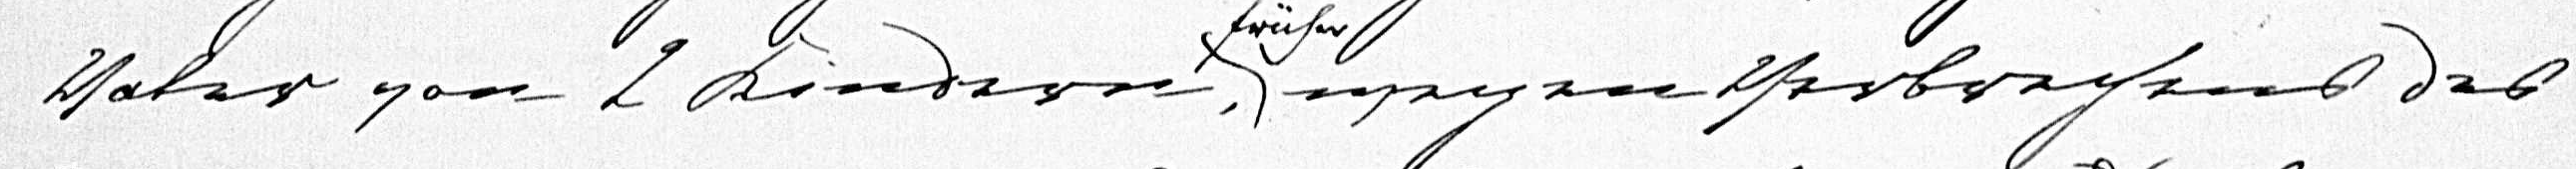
Vater von 2 Kindern, wegen Verbrechens des
